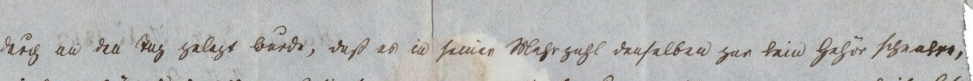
durch an den Tag gelegt wurde, daß es in seiner Mehrzahl denselben gar kein Gehör schenkte,
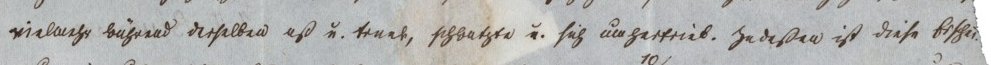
vielmehr während derselben aß u. trank, schwatzte u. sich umhertrieb. Indessen ist diese Erschei-
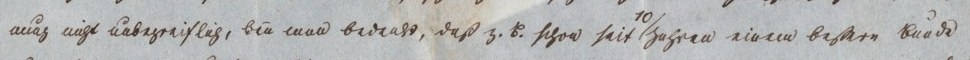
nung nicht unbegreiflich, wenn man bedenkt, daß z. B. schon seit 10 Jahren einem bessern Bunde
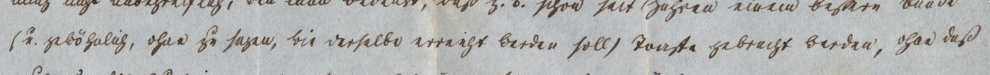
(u. gewöhnlich, ohne zu sagen, wie derselbe erreicht werden soll) Toaste gebracht werden, ohne daß
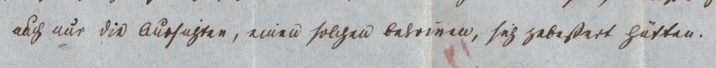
auch nur die Aussichten, einen solchen bekommen, sich gebessert hätten.
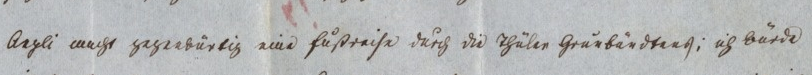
Aepli macht gegenwärtig eine Fußreise durch die Thäler Graubündtens; ich würde
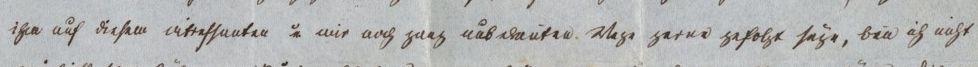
ihm auf diesem intressanten u. mir noch ganz unbekannten Wege gerne gefolgt seyn, wenn ich nicht
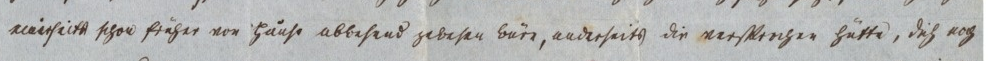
einerseits schon früher von Hause abwesend gewesen wäre, anderseits Dir versprochen hätte, Dich noch
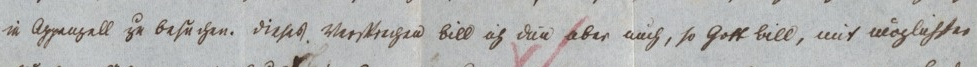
in Appenzell zu besuchen. Dieses Versprechen will ich dann aber auch, so Gott will, mit möglichster
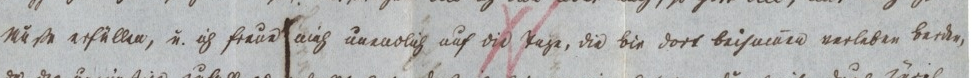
Muße erfüllen, u. ich freue mich unendlich auf die Tage, die wir dort beisammen verleben werden,
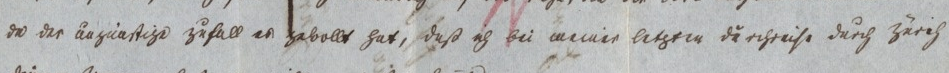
da der ungünstige Zufall es gewollt hat, daß ich bei meiner letzten Durchreise durch Zürich
